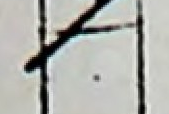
7
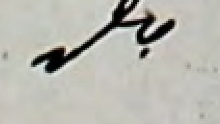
do
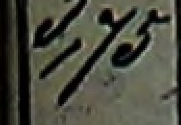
3,75
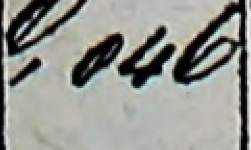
0,046
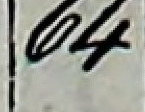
64
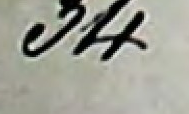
34
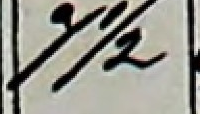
7 1/2
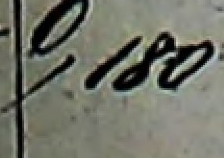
0,180
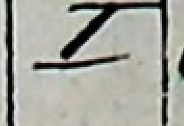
I
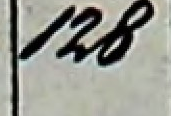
128
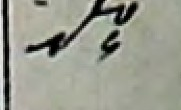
do
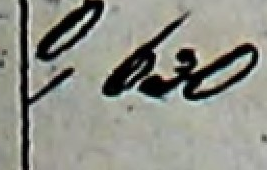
0,630
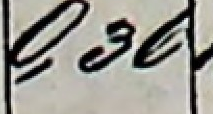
0,36
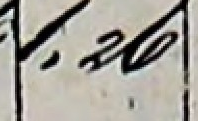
1,26
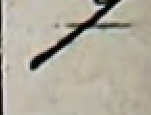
7
